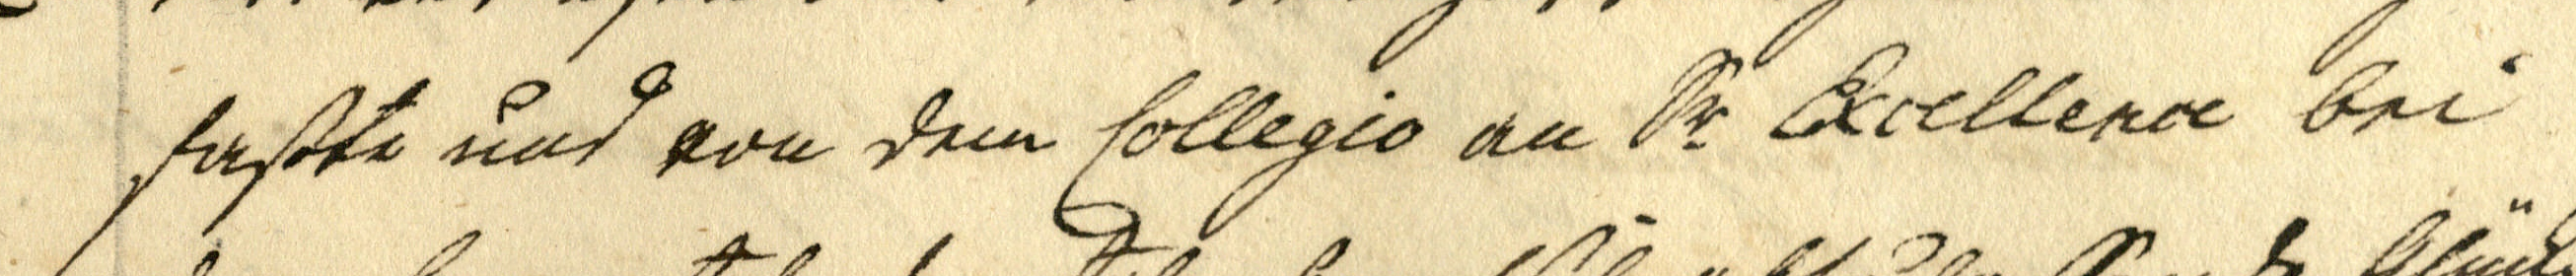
faßte und von dem Collegio an Sr Excellence bei
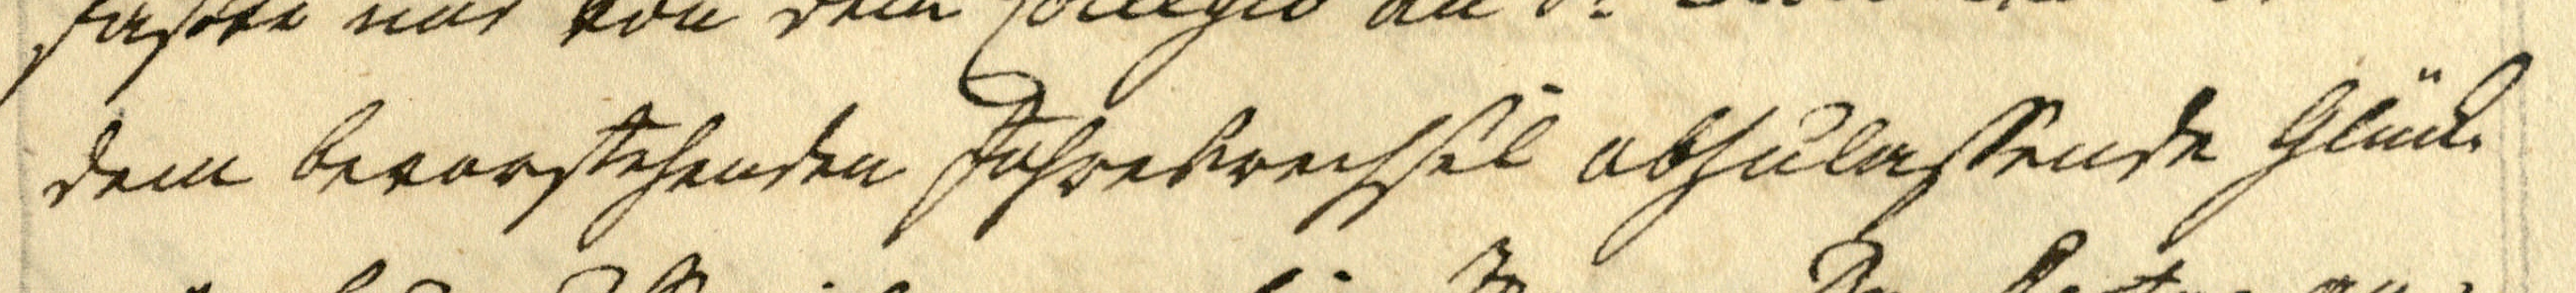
dem bevorstehenden Jahreswechsel abzulassende Glück¬
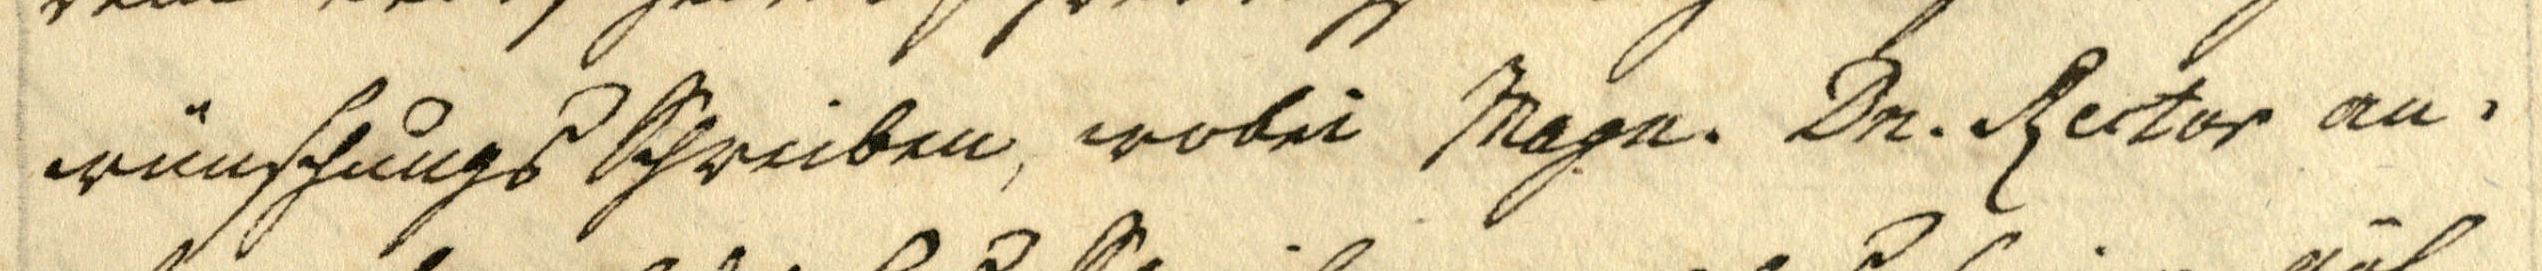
wünschungs Schreiben, wobei Magn. Dn. Rector an¬
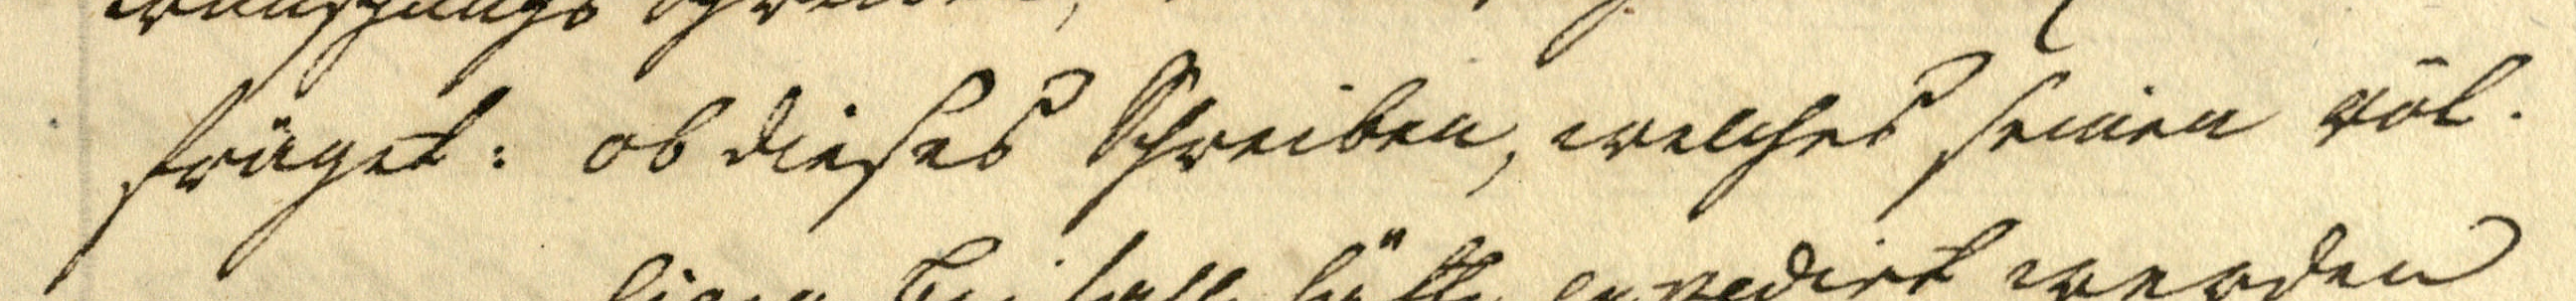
fräget: ob dieses Schreiben, welches seinen völ¬
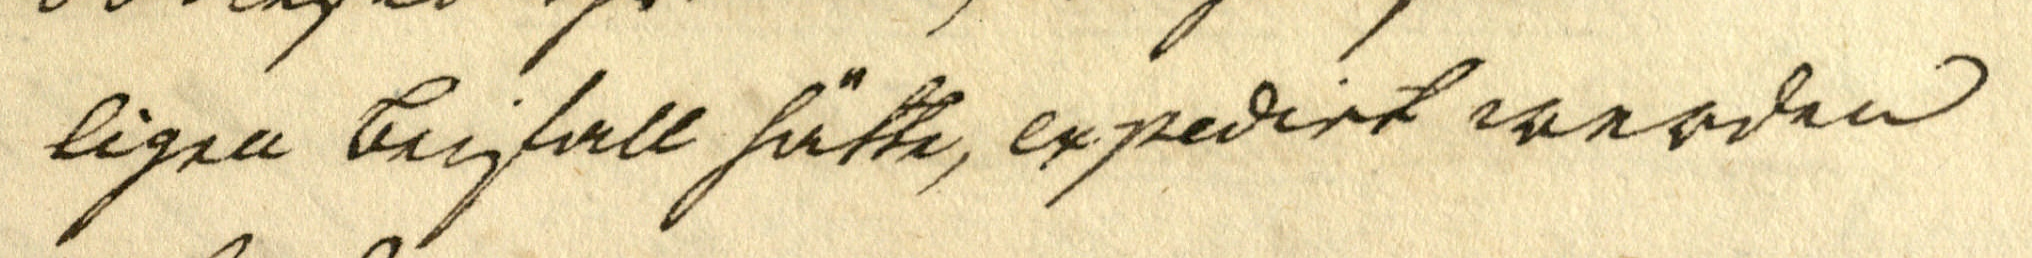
ligen Beifall hätte, expedirt werden
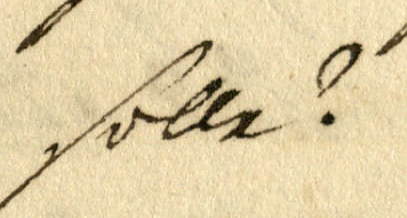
solle?
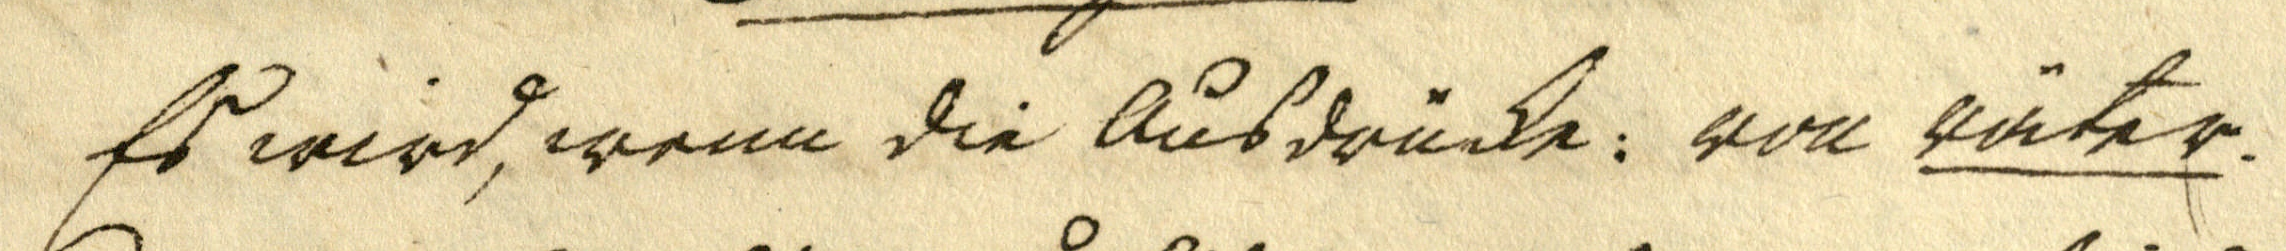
Es wird, wenn die Ausdrücke: von väter¬
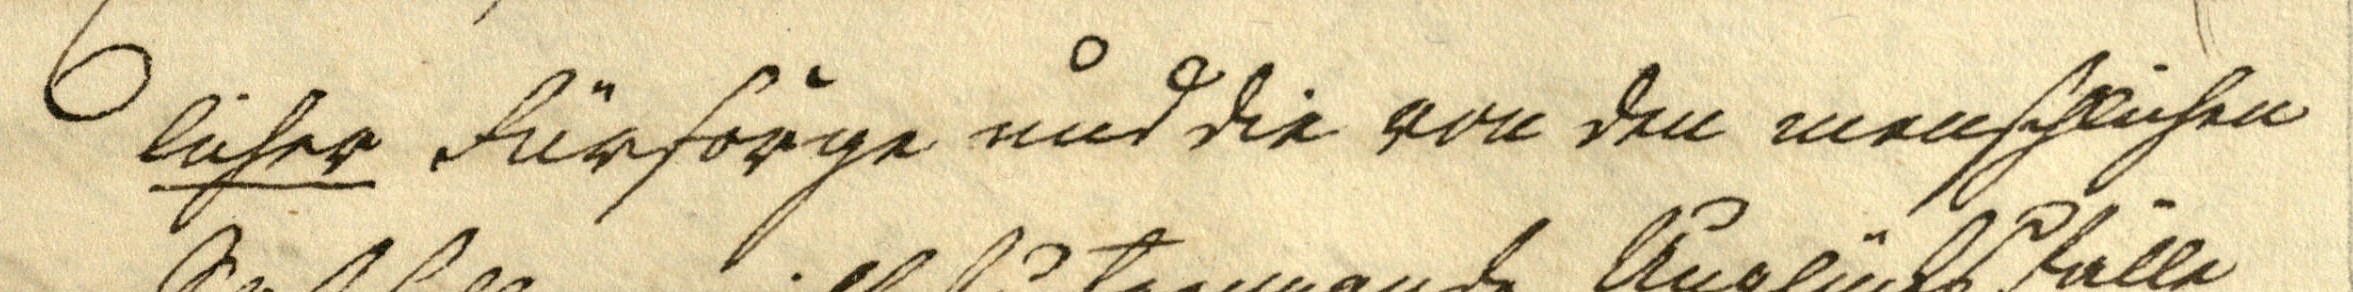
licher Fürforge und die von den menschlichen
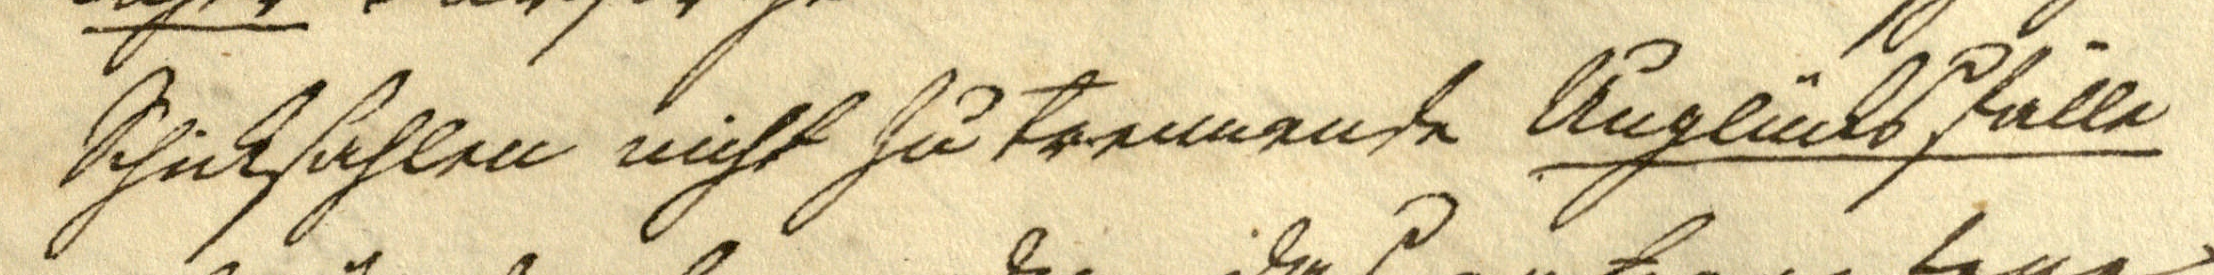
Schicksahlen nicht zu trennende Unglücksfälle
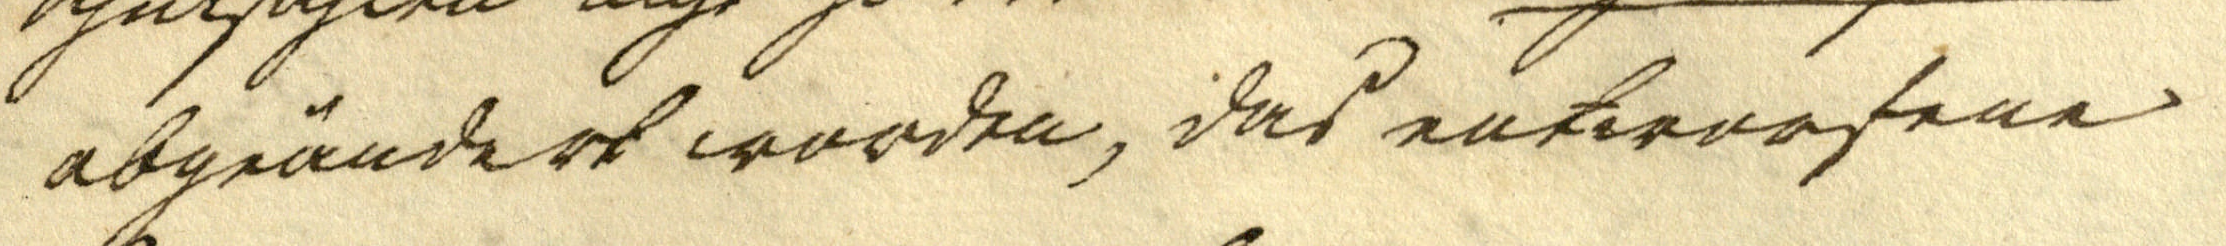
abgeändert worden, das entworfene
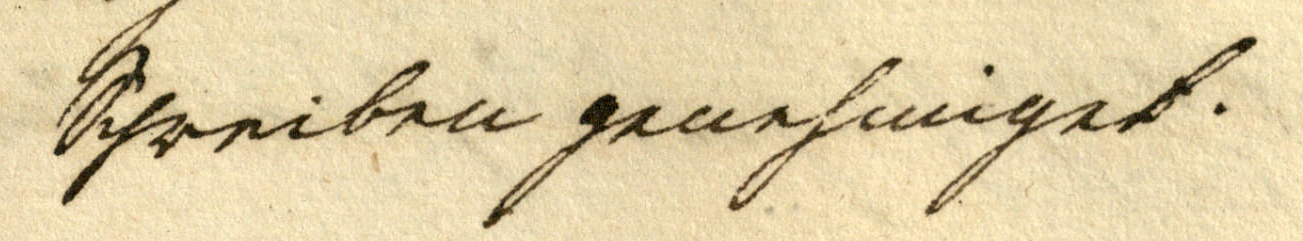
Schreiben genehmiget.
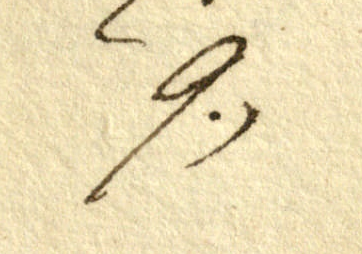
9.,
